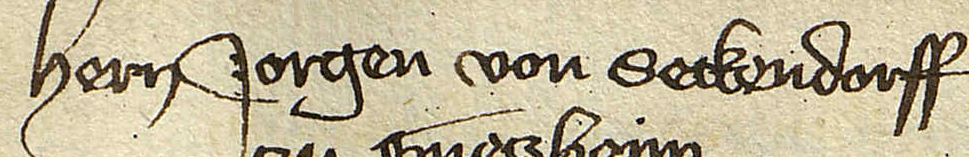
hern Iorgen von Seckendorff
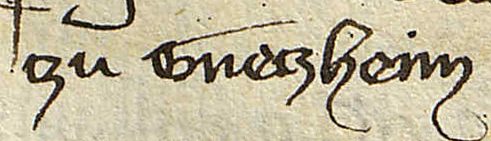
cʒu Gnecʒheim
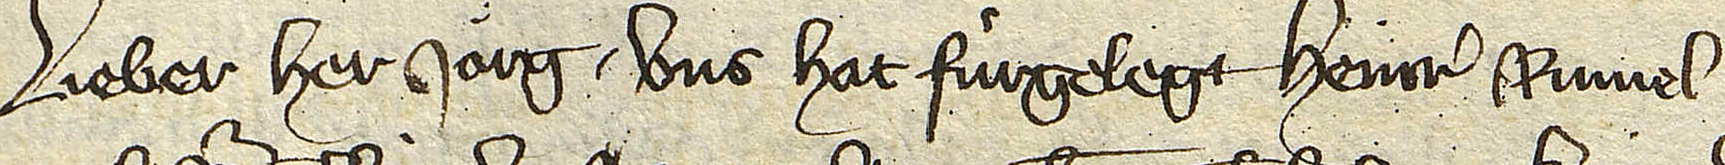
Lieber her Iörg / Vns hat fürgelegt Heinr* Rumel
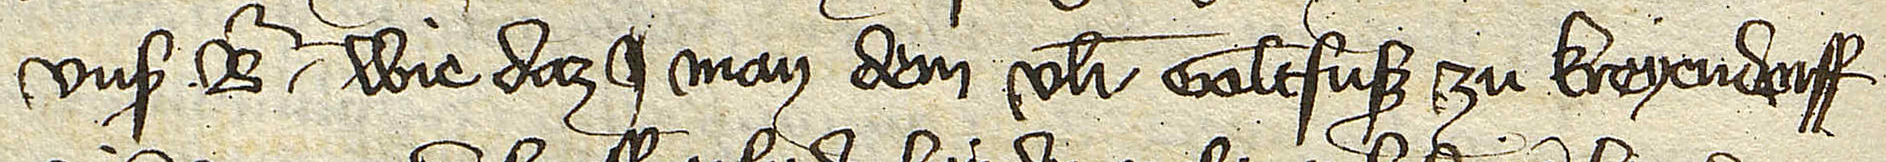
vnſ* B* / wie daʒ I man dem vlr* Goltſuſʒ cʒu Kreyendorff
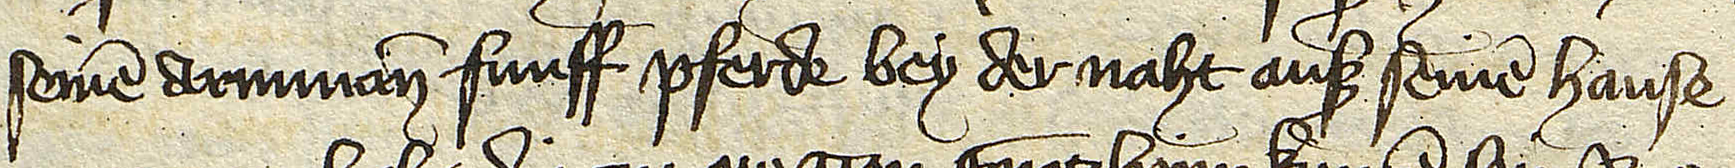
ſeine* Armman* funff pferde bey der naht auſʒ ſeine* hauſe
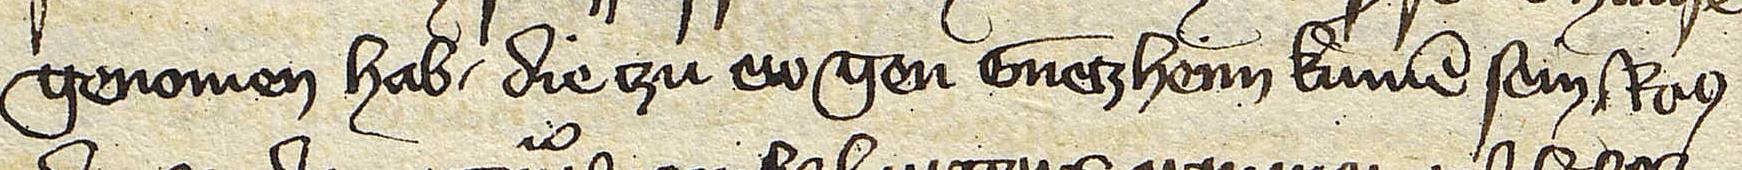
genomen hab / die cʒu ew gen Gnecʒheim kume* ſein / Ro*
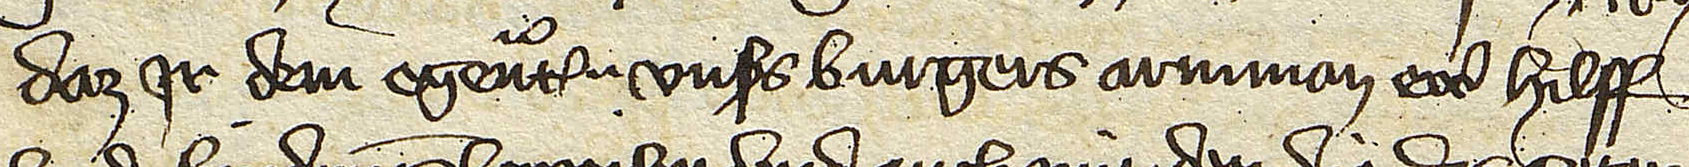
daʒ Ir dem egen*t* ~ vnſ*s burgers armman ew* hilff
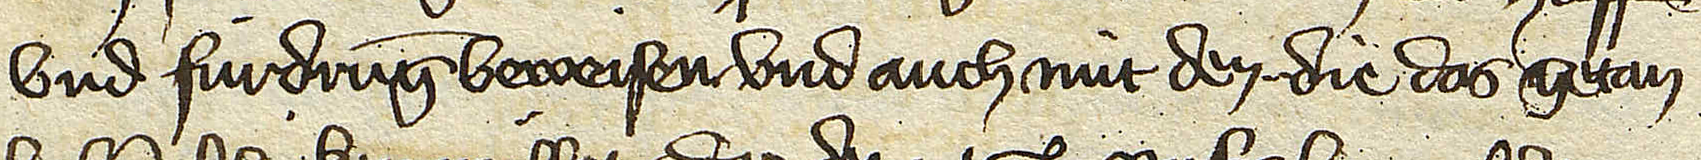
vnd fürdrug* beweiſen / vnd auch mit den ~die das getan
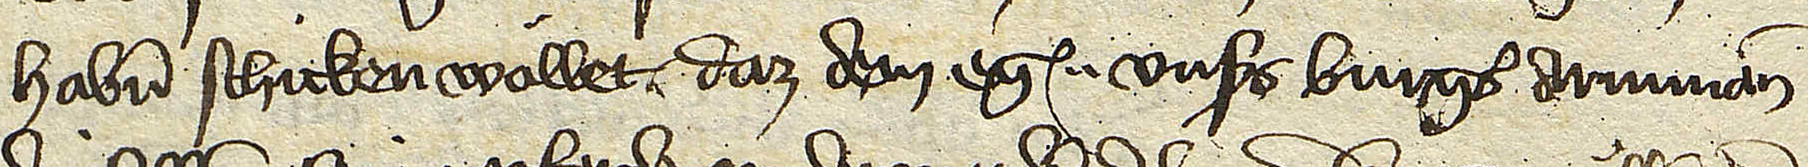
habn* ſchicken wöllet / daʒ dem eg* ~ vnſ*s burgs* Armman*
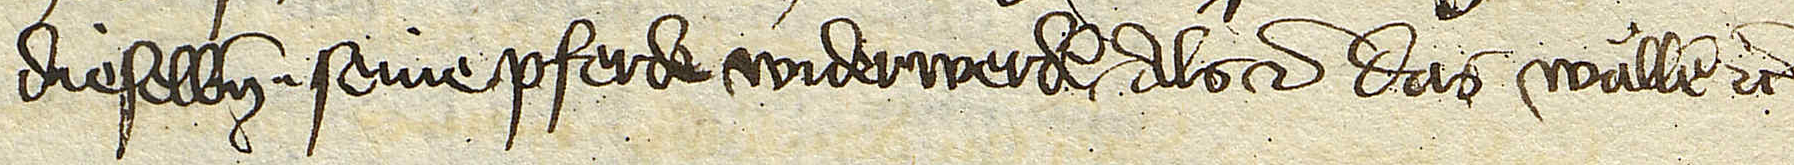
dieſelbn* ~ ſeine pferde widerwerd* / Als ec* das wölle ec*
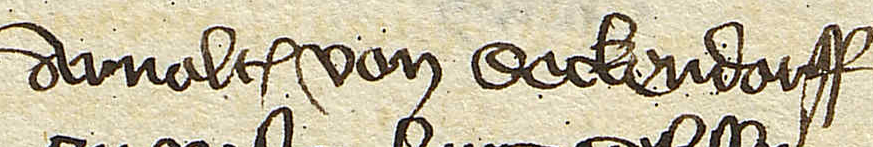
Arnolt von Seckendorff
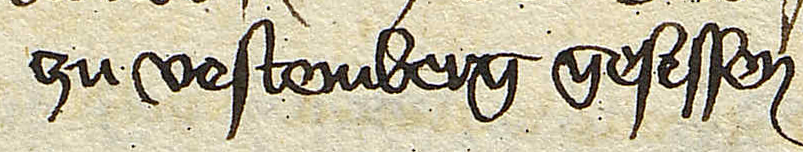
cʒu veſtemberg geſeſſen
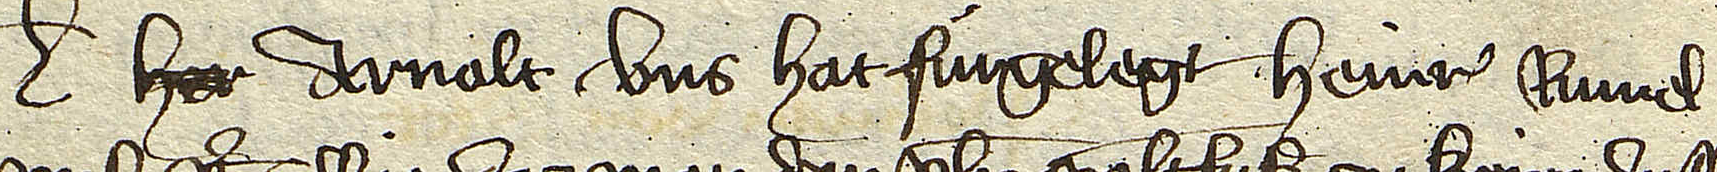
L* her Arnolt / vns hat fürgelegt heinr* Rumel
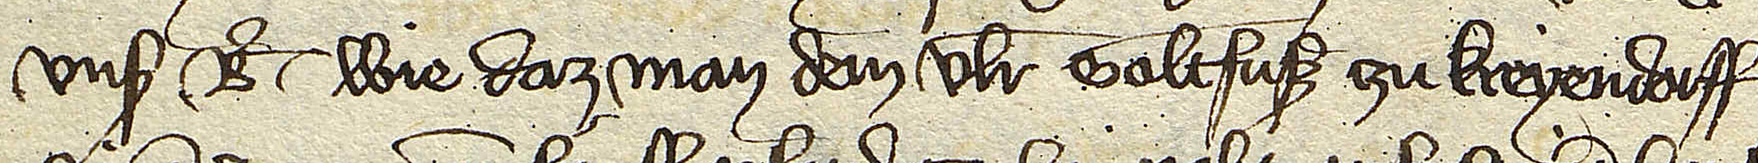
vnſ* B* / wie daʒ man dem vlr* Goltfuſʒ cʒu Kreyendorff
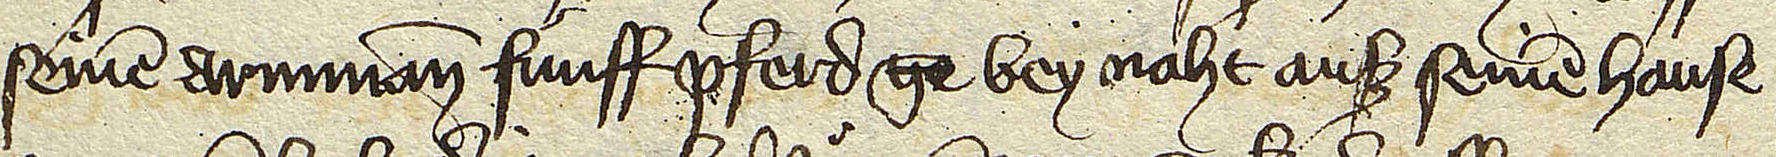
ſeine* Armman* fünff pferd ge bey nahr auſʒ ſeine* hauſe
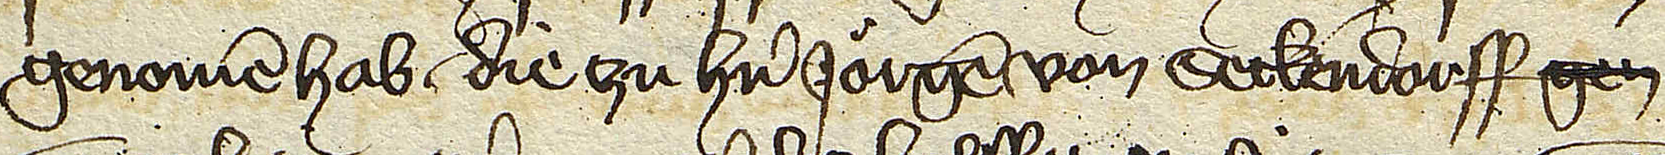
genome* hab / die cʒu hn* Iörge* von Seckendorff gen
